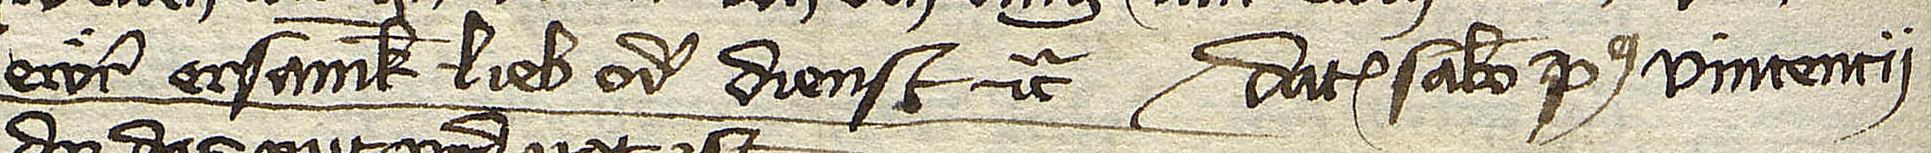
eẅr erſamk* lieb od* dienſt* ec* / Dat* ſab*o p* vincencii
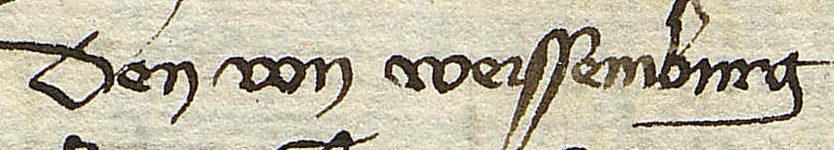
Den von weiſſemburg
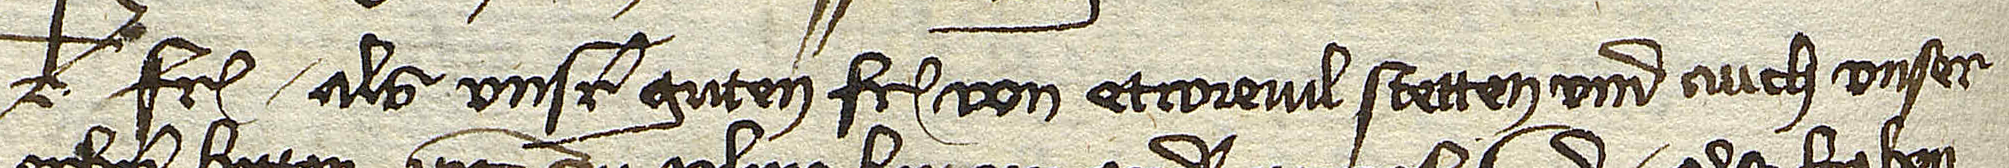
L* fr* / als vnſ*r guten fr* von etwieuil ſtetten vnd auch vnſer
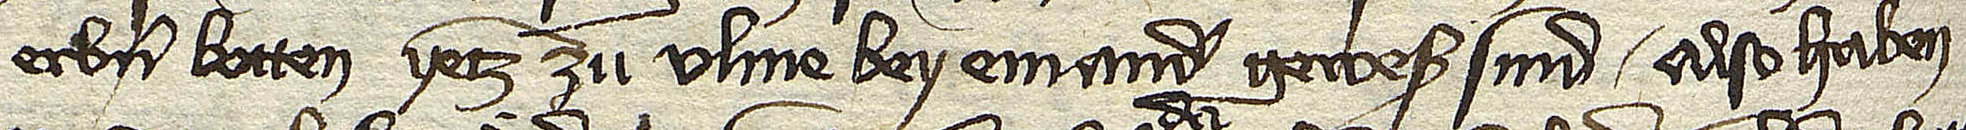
erb*n botten yecʒ* ʒu vlme bey einand* geweſ* ſind / alſo haben
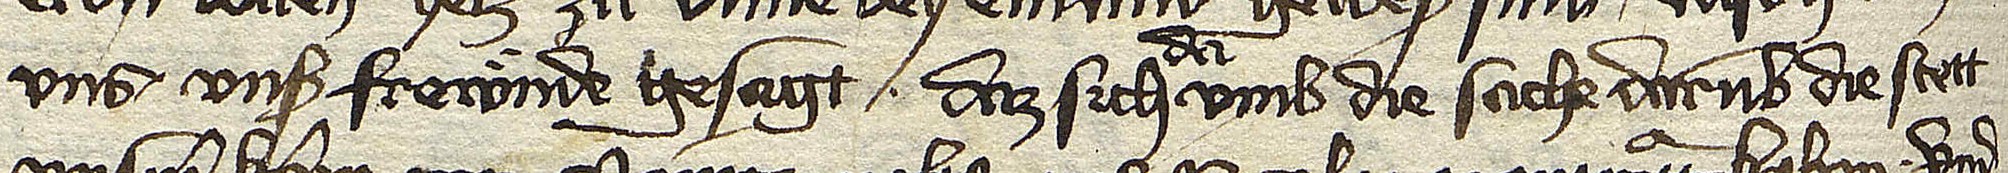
vns vnſ* freẅnde geſagt . daʒ ſich vmb die ſache darub* die ſtett
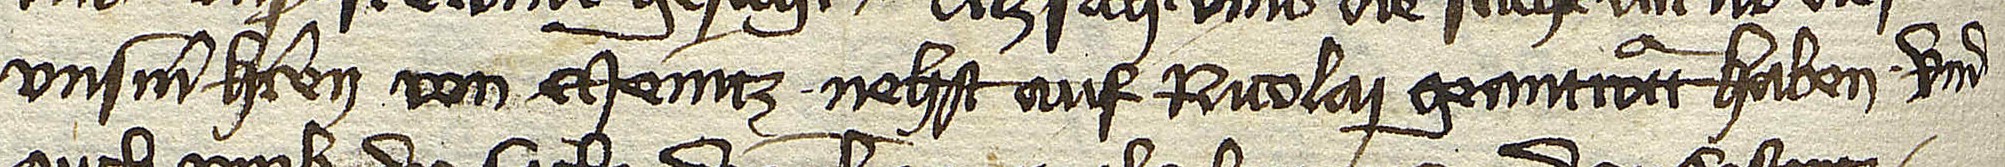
vnſ*m h*ren von Meincʒ . nehſt auf Nicolai geantw*tt haben . Vnd
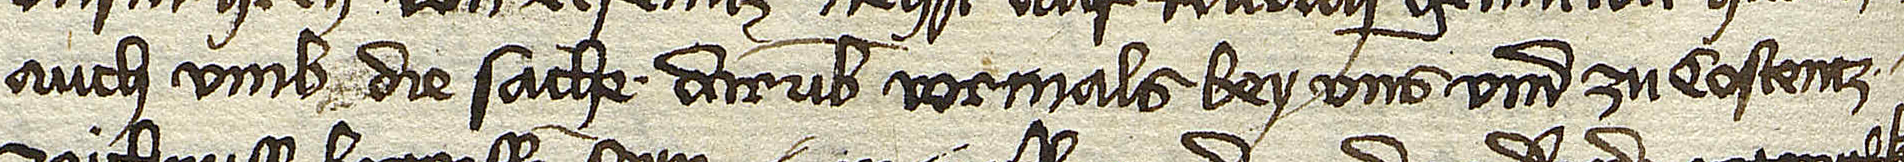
auch vmb die ſache . darub* vormals bey vns vnd ʒu Coſtencʒ /
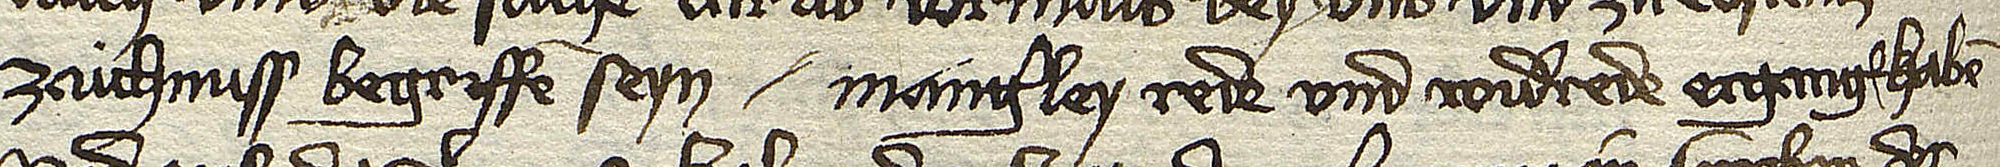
ʒaichnuſſ begriffe* ſeyn / mang*ley rede vnd wid*rede ergang* habe*
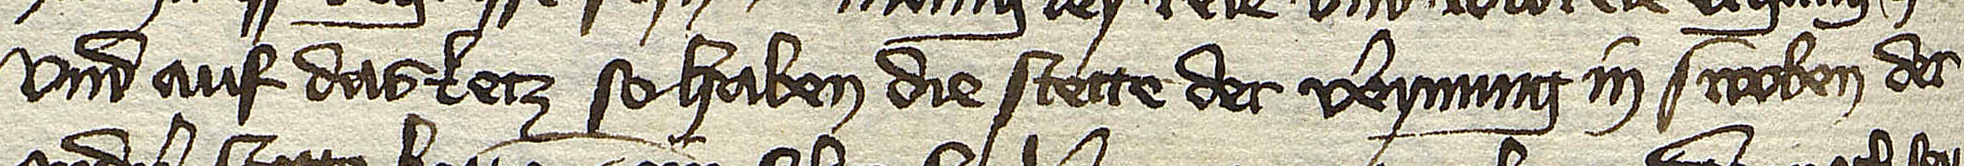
Vnd auf das lecʒ ſo haben die ſtette der v*eynung in ſwoben der
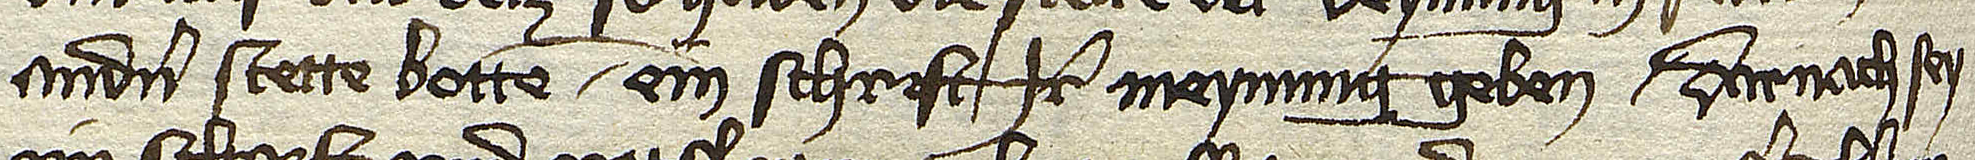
and*n ſtette botte* / ein ſchrift Ir* meynung geben / Darnach ſey
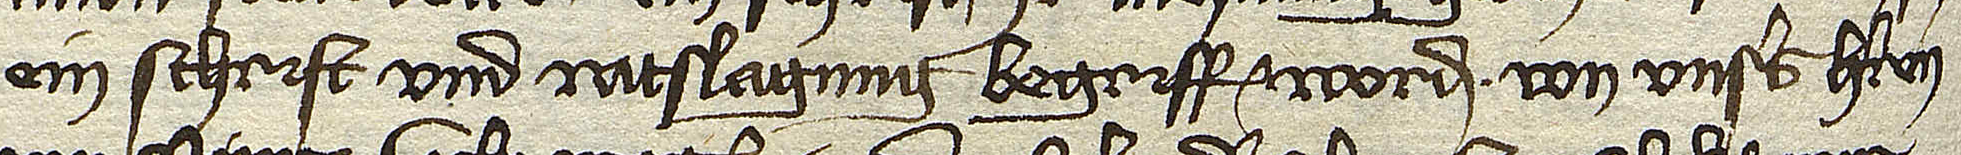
ein ſchrift vnd ratſlagung begriff* word* . von vnſ*s h*ren
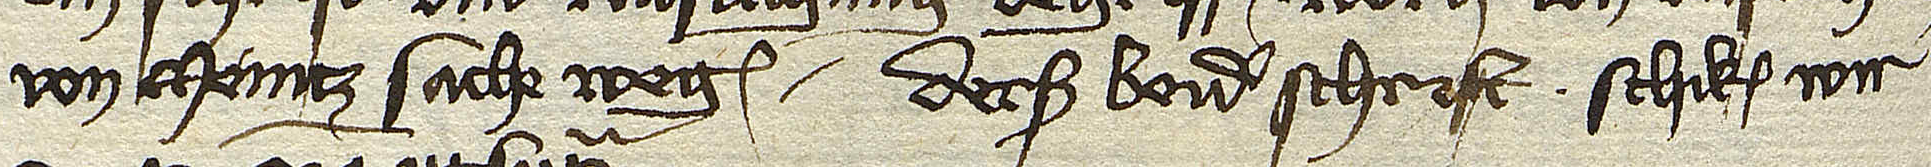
von Meincʒ ſache weg* / derſ* beid* ſchrift . ſchik* wir
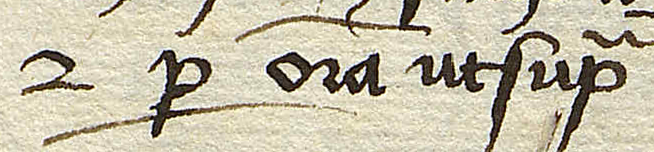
@ p* oia* ut ſup*
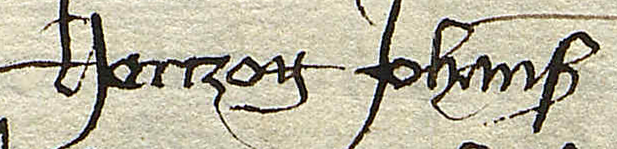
Hercʒog Iohanſ*
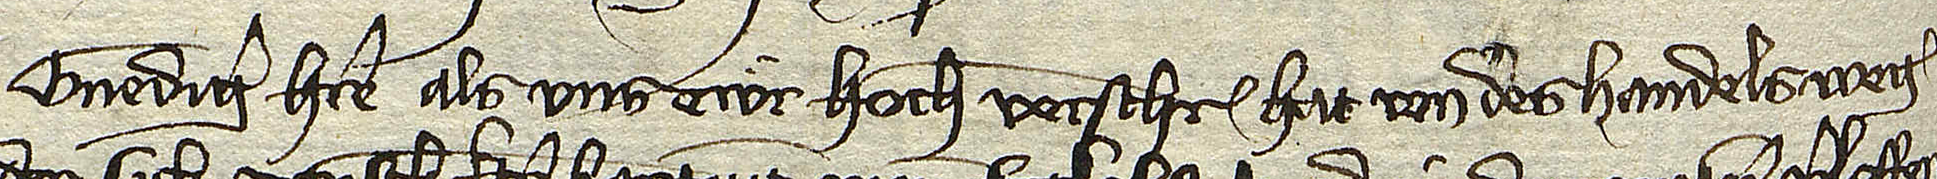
Gnedig* h*re als vns eẅr hoch* verſchr* hat von des handels weg*
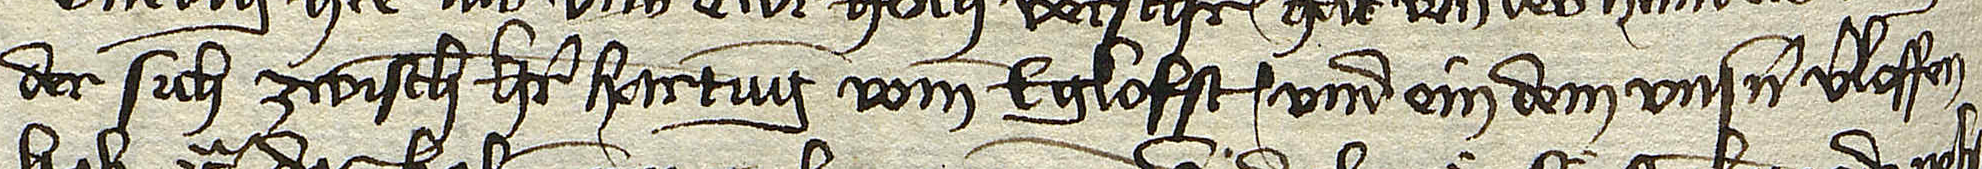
der ſich ʒwiſch* h*r hartu*g vom* Eglofſt* vnd ein dem vnſ*n v*loffen
